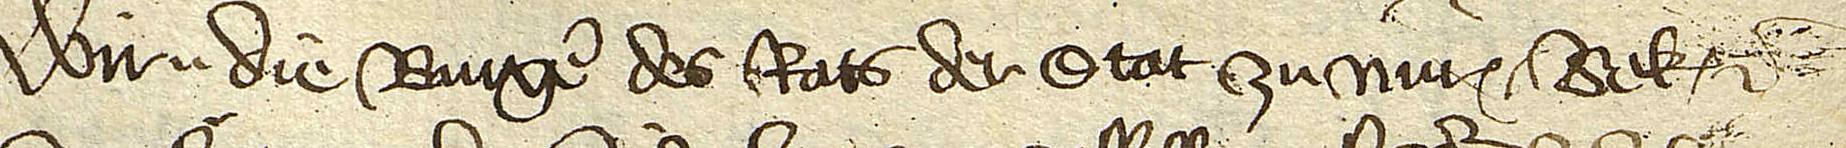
Wir ~ die Burge* des Rats der Stat cʒu Nür* / Bek* ec*
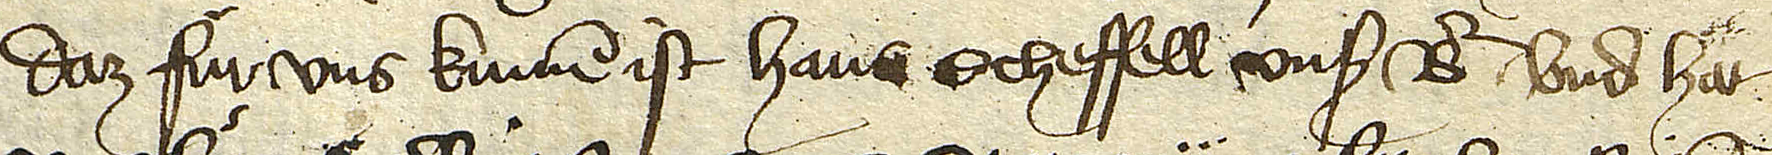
daʒ für vns kume* iſt hans Scheffell vnſ* B* / vnd hat
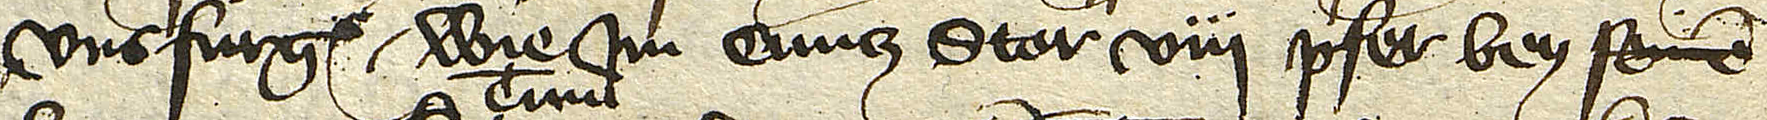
vns fürg* / wie Im Cuncʒ Stor viii pfer bey ſeine*
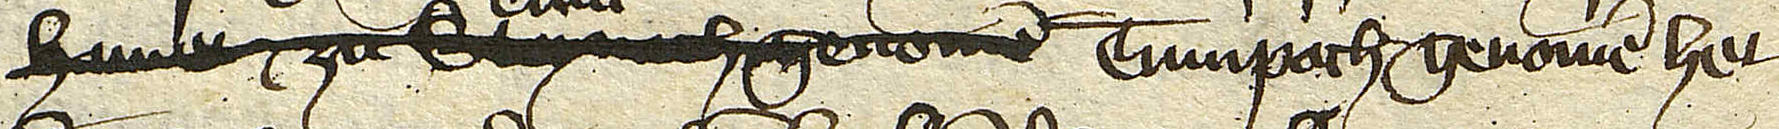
hamer cʒu Steynach genome* Tumpach genome* het
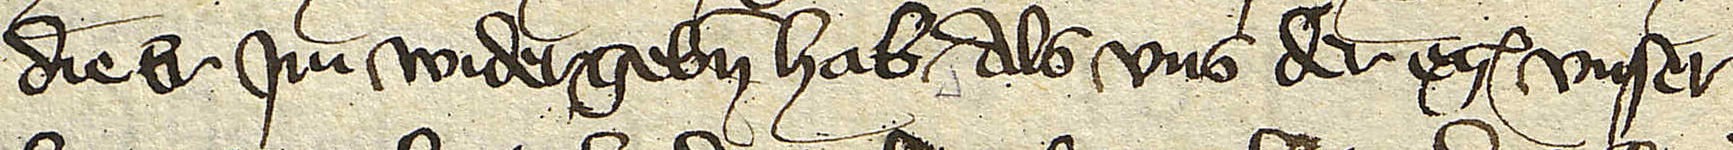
die Er Im widergebn* hab / Als vns der eg* vnſer
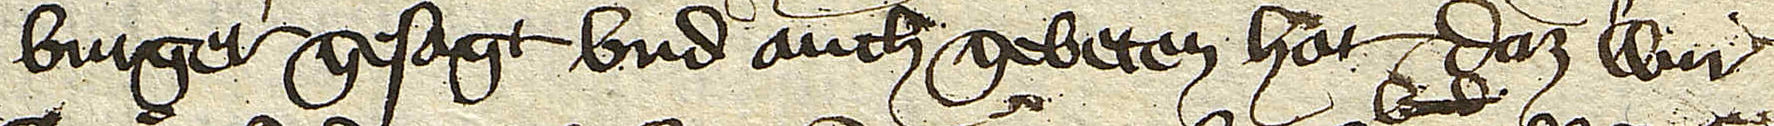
burger geſagt vnd auch gebeten hat / daʒ wir
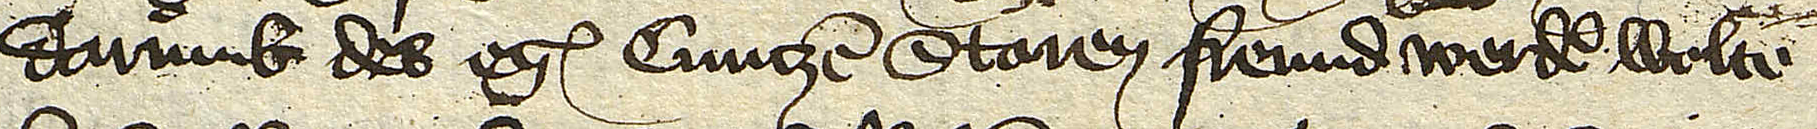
darümb des eg* Cuncʒe* Stören freund werd* wolte*
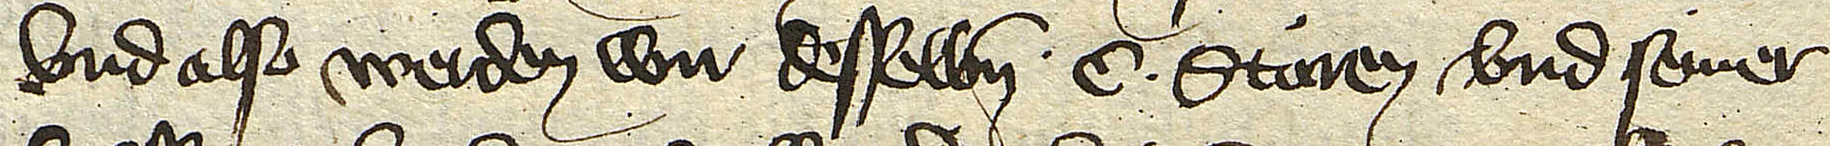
vnd alſo werden wir deſſelbn* C . Stören / vnd ſeiner
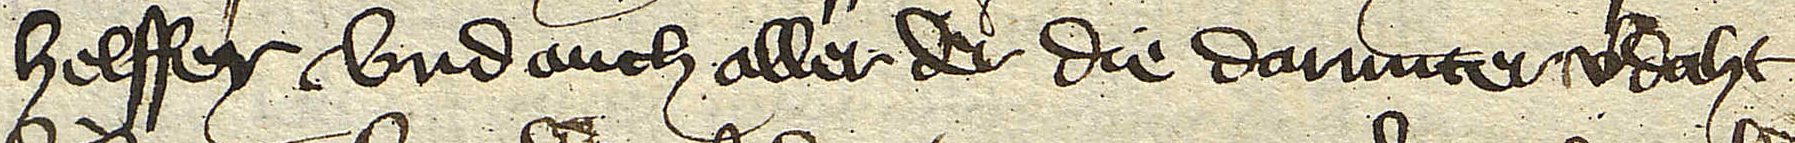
helffer / vnd auch aller der die darunter v*daht
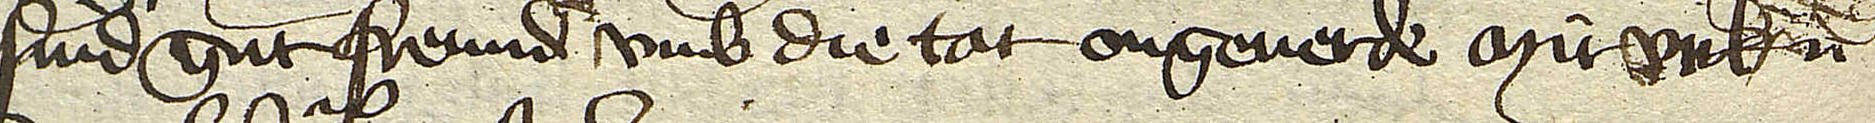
ſind gut freund vmb die tat ongeuerde mit vrk* ec*
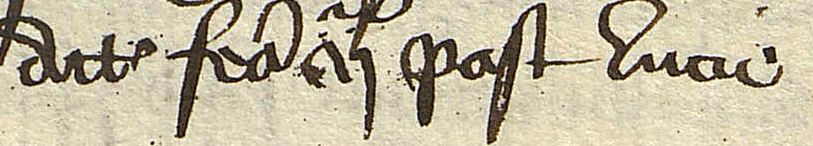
Act* fea* vi* poſt Lucie
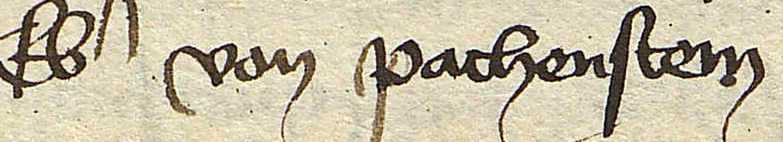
Eb* von Pachenſtein
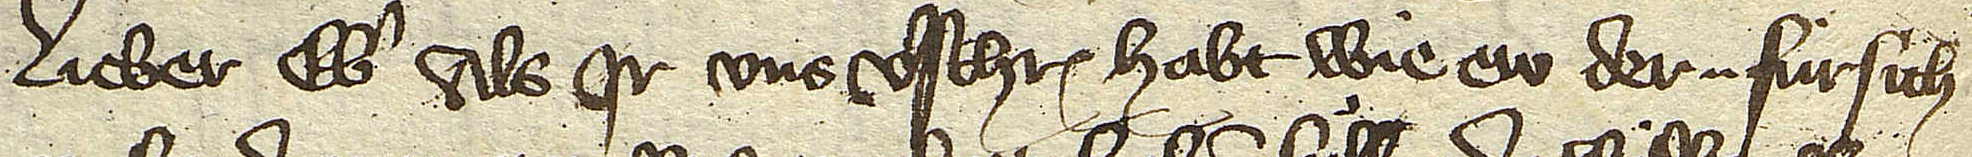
Lieber Eb* Als Ir vns v*ſchr* habt wie ew der ~ für ſich
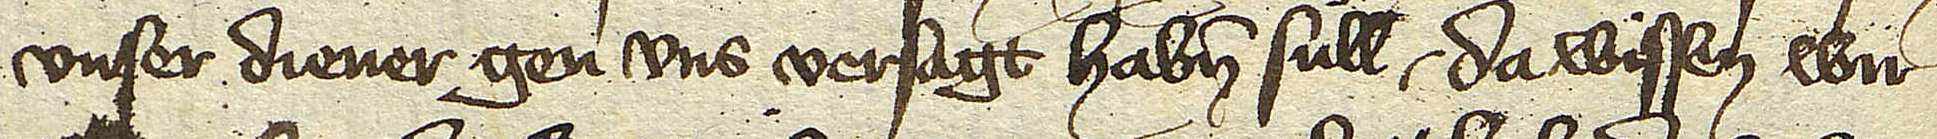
vnſer diener gen vns verſagt habn* ſüll / da wiſſen wir
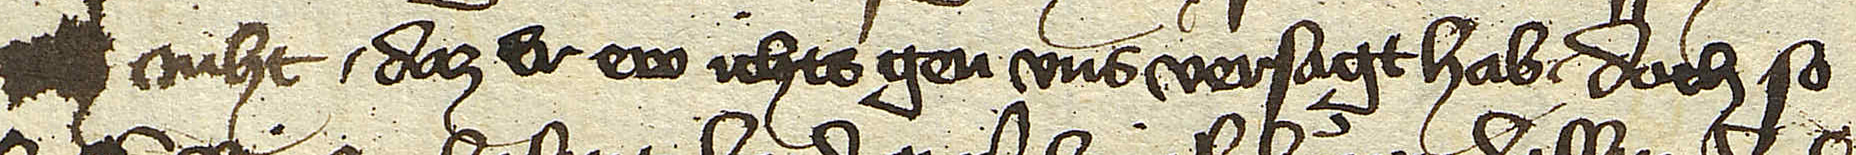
%h niht / daʒ Er ew ichts gen vns verſagt hab / doch ſo
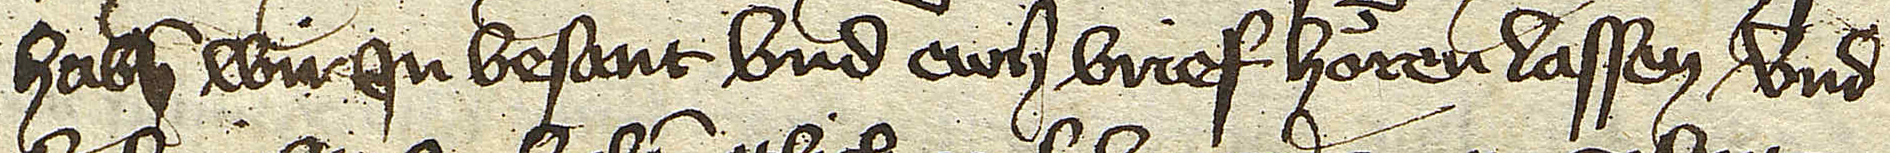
habn* wir In beſant vnd ew*n brief hören laſſen / vnd
